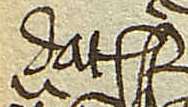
dat* f*
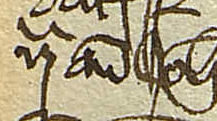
ii* an* Ioh*
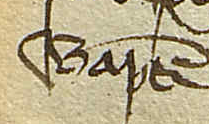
Bapte*
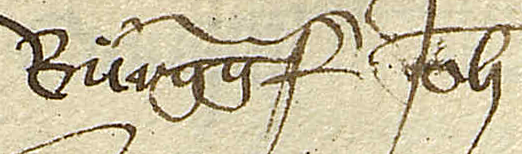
Bürgg*f Ioh*
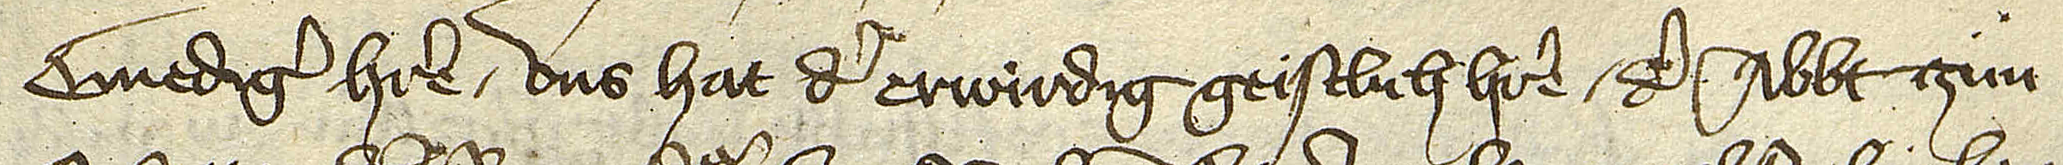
Gnedig* hr*e / Vns hat d* erwirdig geiſtlich hr*e / d* Abbt cʒün
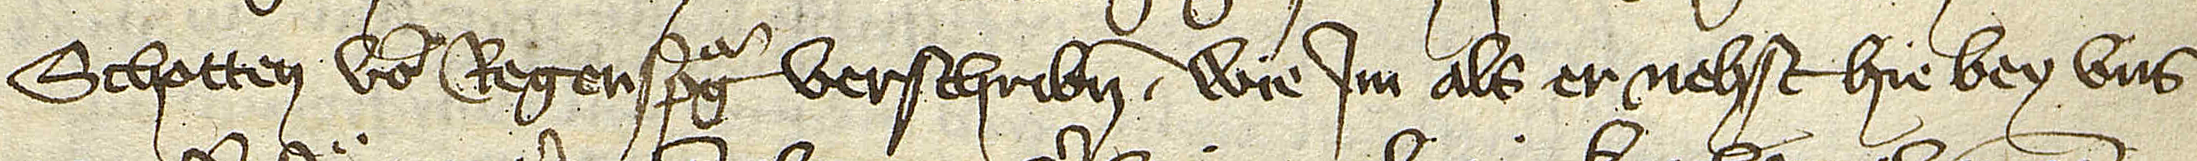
Schotten vo* Regenſp*g verſchribn* / wie Im als er nehſt hie bey vns
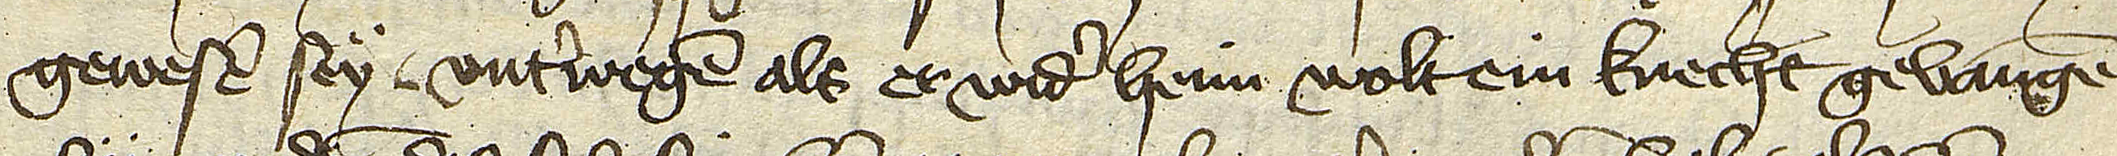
geweſe* ſey / vnt*wege* als er wid* heim wolt ein knecht gevange*
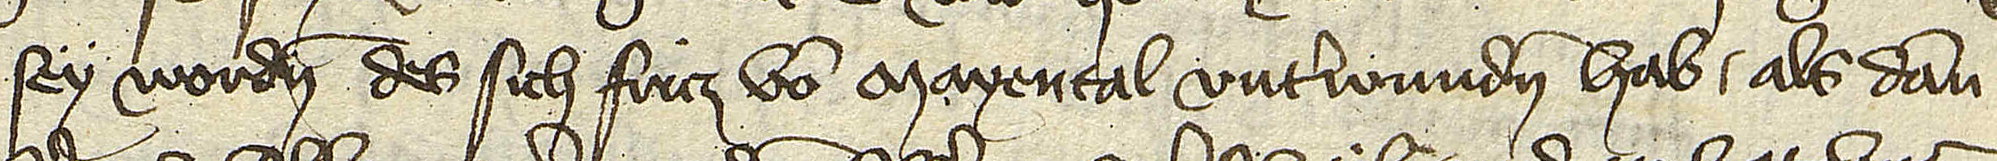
ſey wordn* des ſich fricʒ vo* Mayental vnt*wundn* hab / als dan*
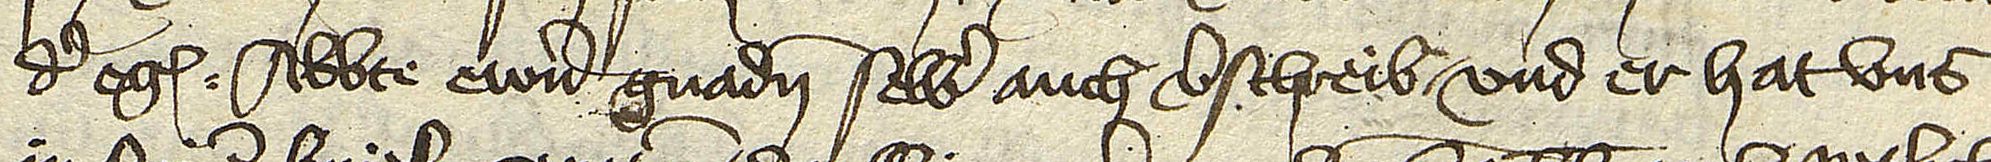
d* eg* . Abbte ewn* gnadn* ſelb* v*ſchreib / vnd er hat vns
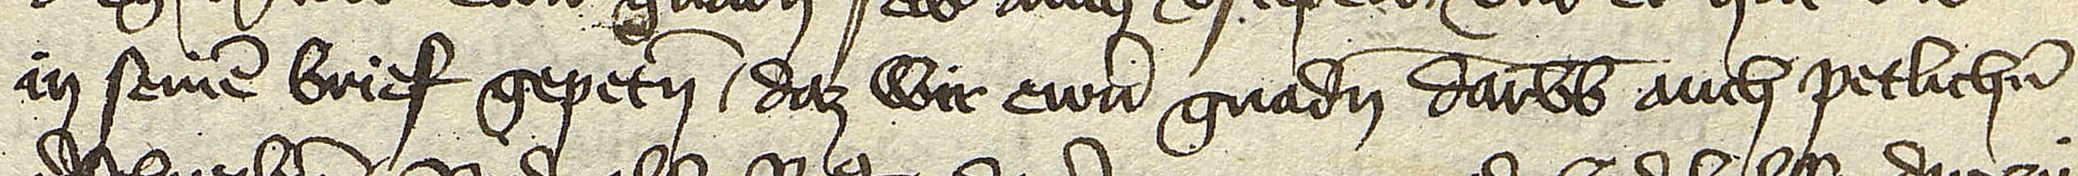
in ſeine* brief gepetn* / daʒ wir ewn* gnadn* darv*b auch petlichn*
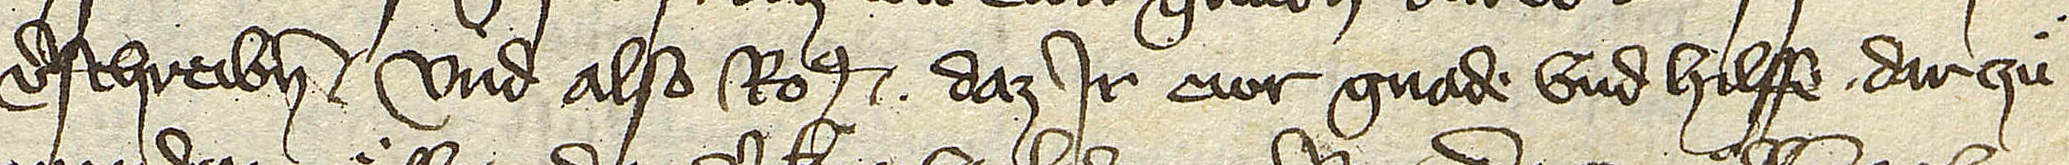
v*ſchreibn* / vnd alſo Ro* / . daʒ Ir ewr gnade vnd hilffe darcʒü
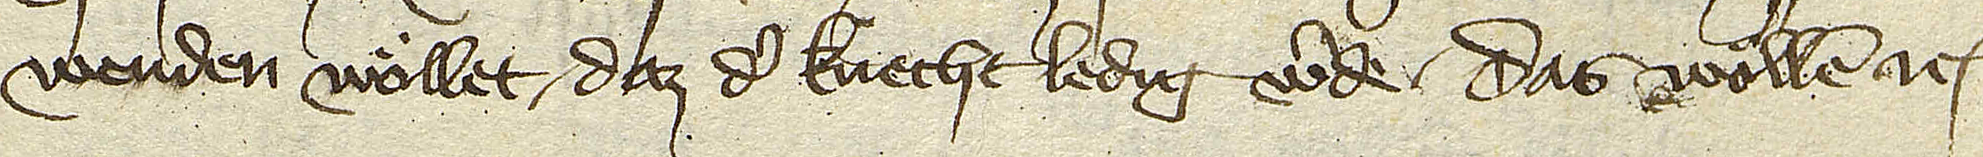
wenden wöllet / daʒ d* knecht ledig w*de / Das wölle* ec*
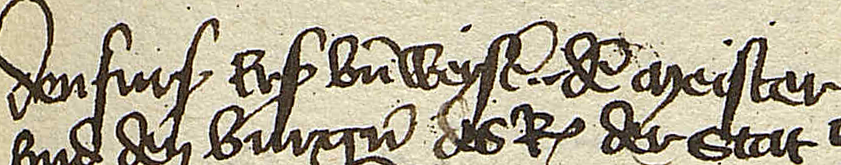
den furſ* Erſ* vn* weyſe* ~ de* Meiſter
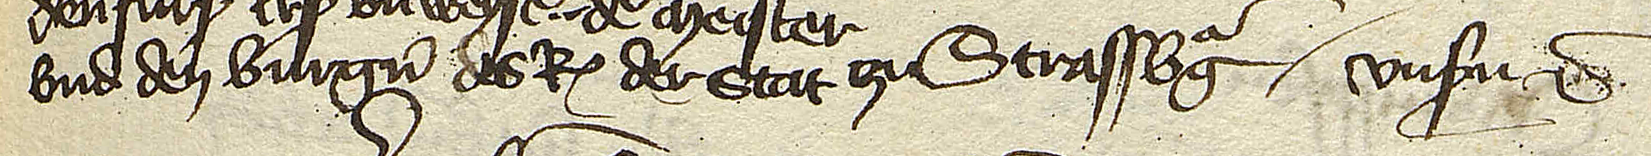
vnd den burgn* des R* der Stat cʒu Straſſb*g / vnſ*n ec*
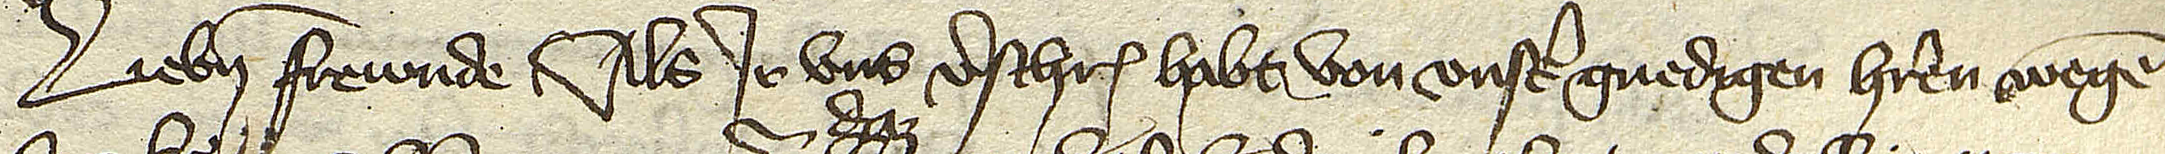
Liebn* frewnde / Als Ir vns v*ſchr* habt von vnſs* gnedigen hr*en wege*
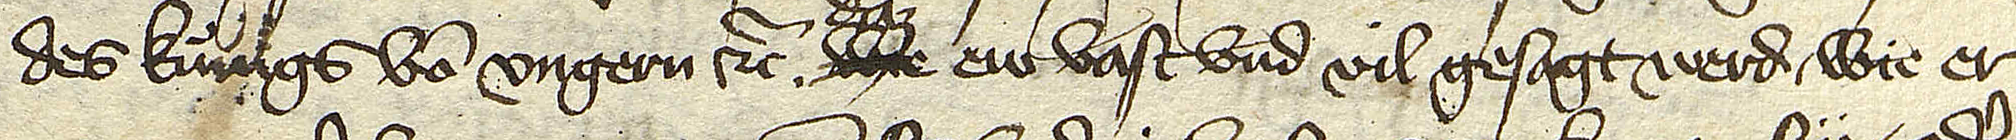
des künigs vo* vngern ec* wie ew vaſt vil geſagt werd / wie er
